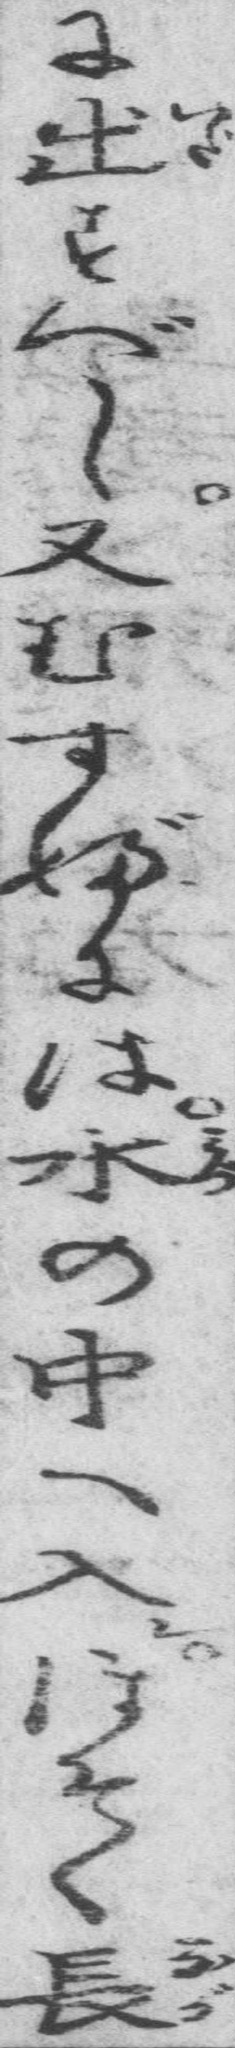に出すべし。又むすぶには。水の中へ入れ。ほそく長
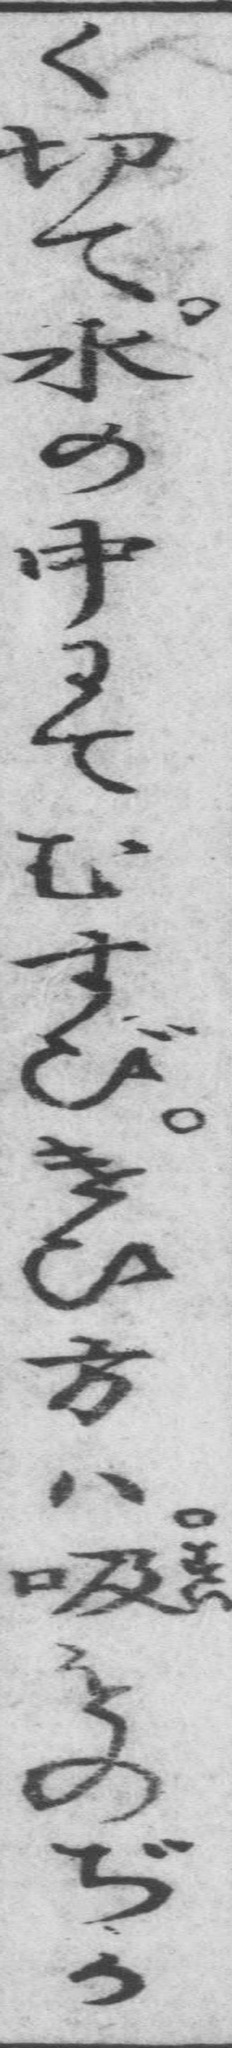く切て。水の中にてむすび。遣ひ方は。吸ものぢか

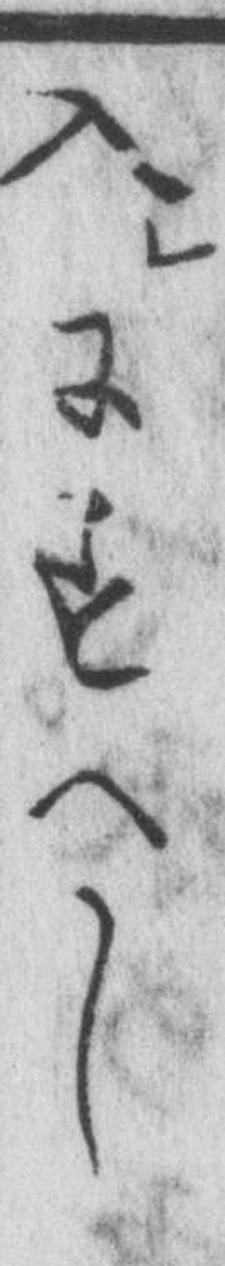入れにすへし
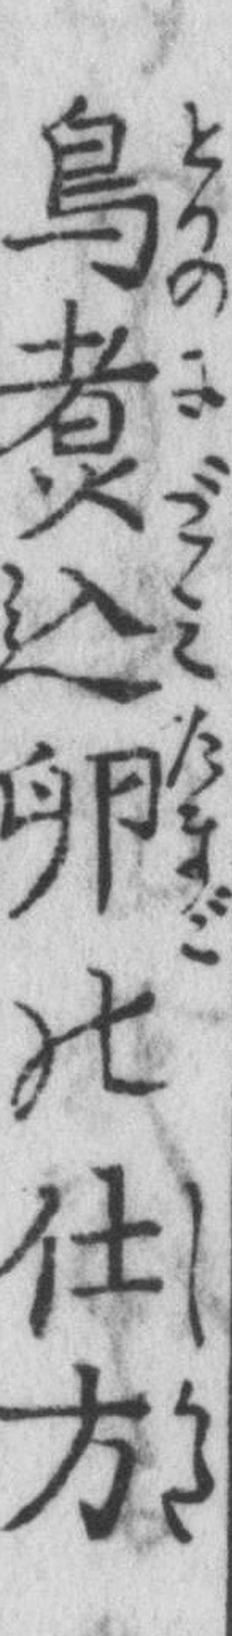鳥煮込卵の仕方
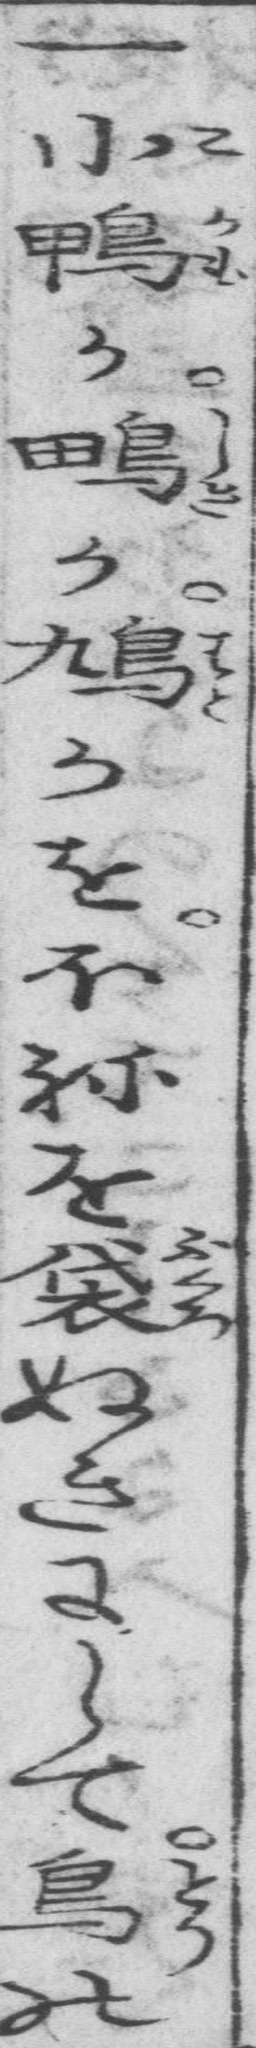一小鴨か。鴫か。鳩かを、ほねを袋ぬきにして。鳥の
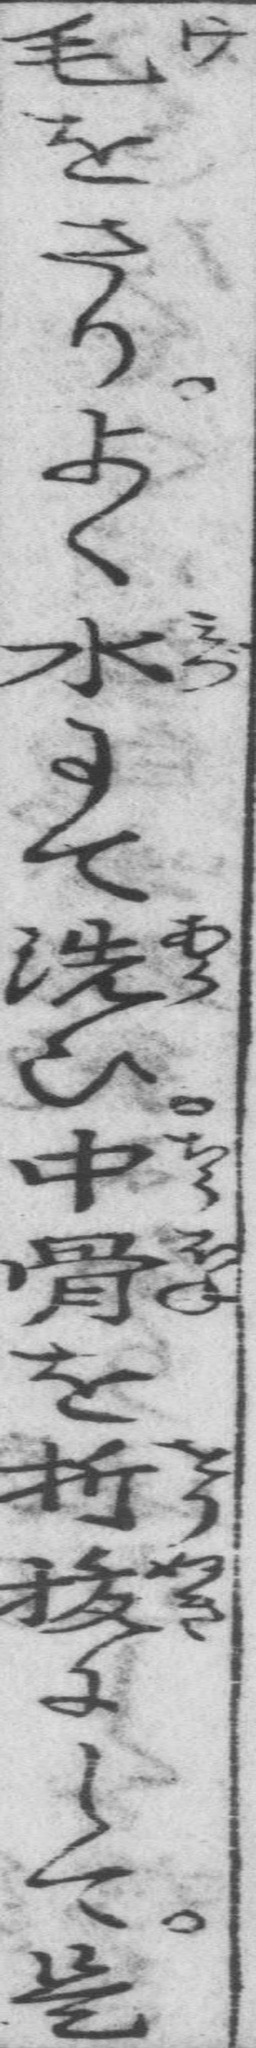毛をさり。よく水にて洗ひ。中骨を折抜にして。是
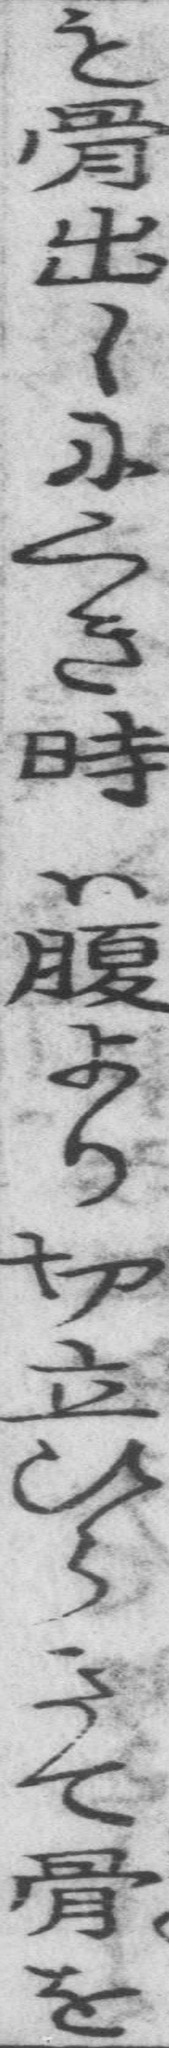も骨出しにくき時は。腹より切。立ひらきて。骨を
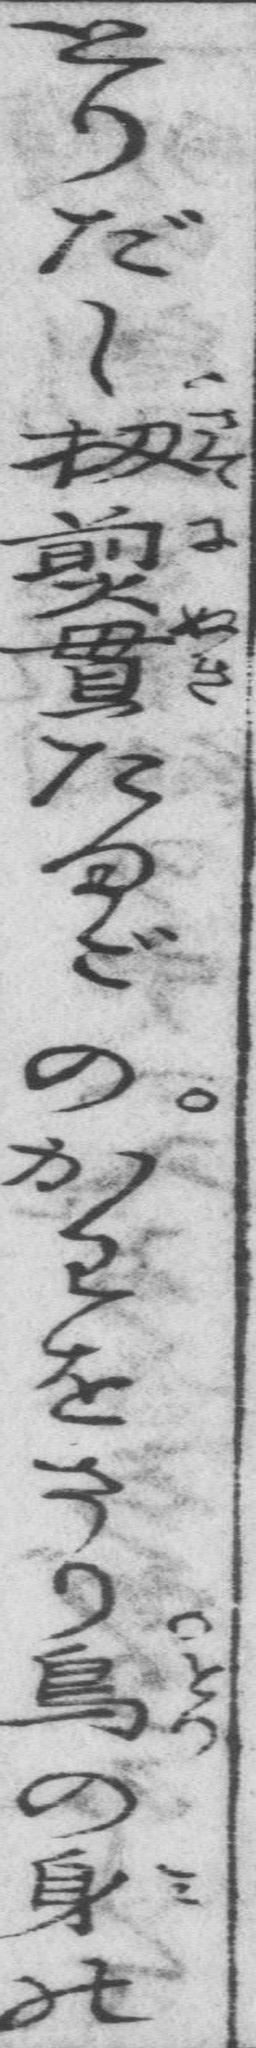とりだし。扨煎貫たまごの。かわをさり。鳥の身の
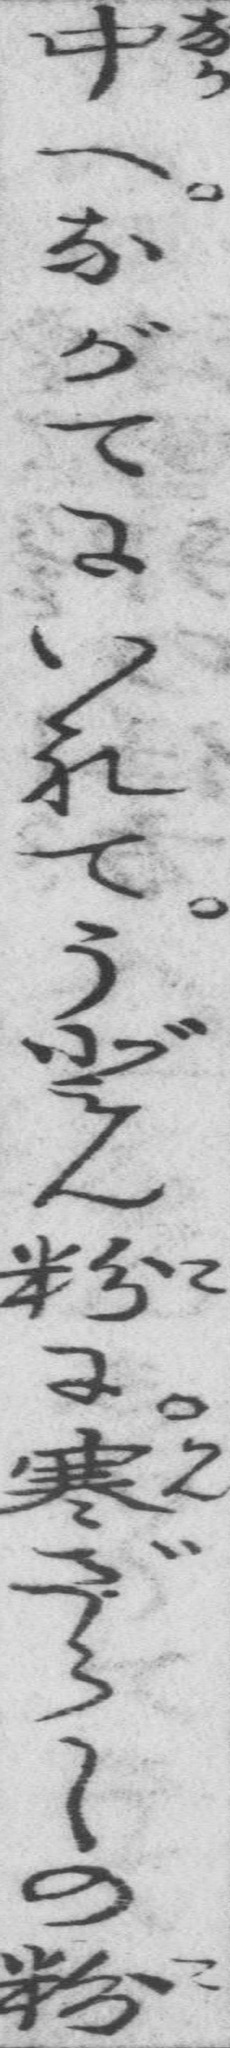中へ。ながてにいれて。うどん粉に。寒ざらしの粉
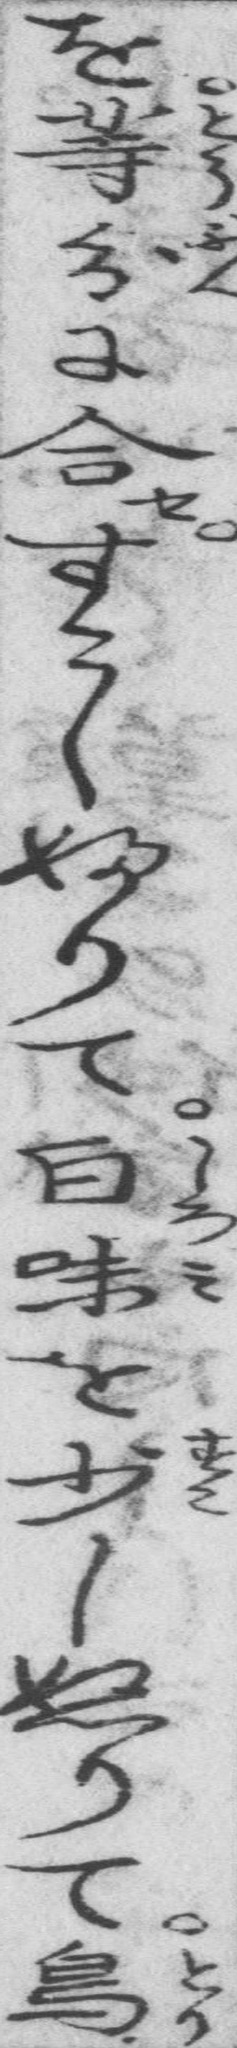を。等分に合せ。すこしふりて。白味を少しぬりて。鳥
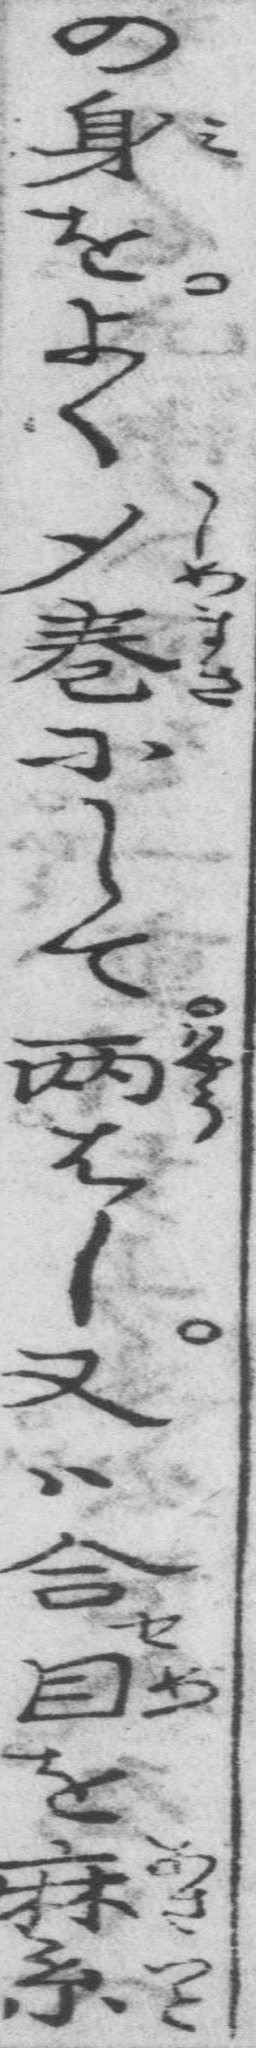の身を。よく〆巻にして。両はし。又は合せ目を麻糸
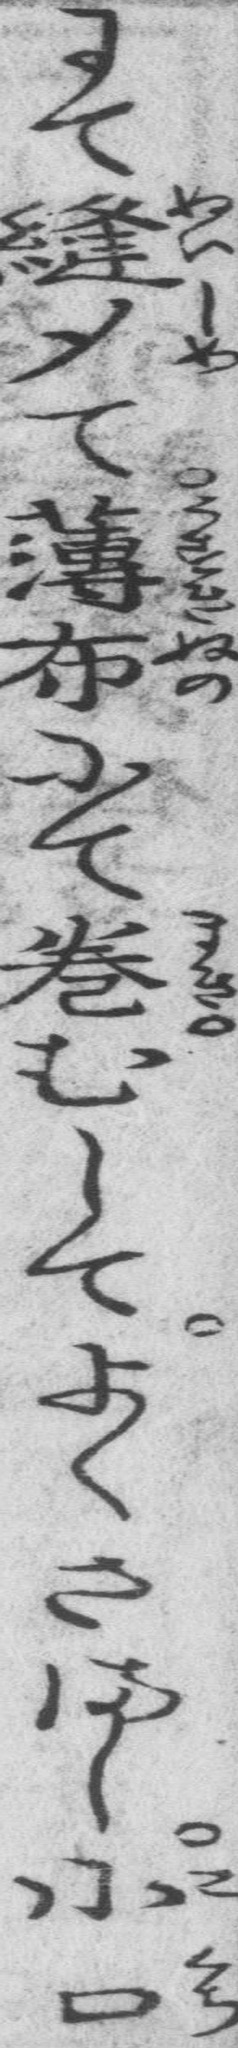にて縫〆て。薄布にて巻。むして。よくさまし。小口
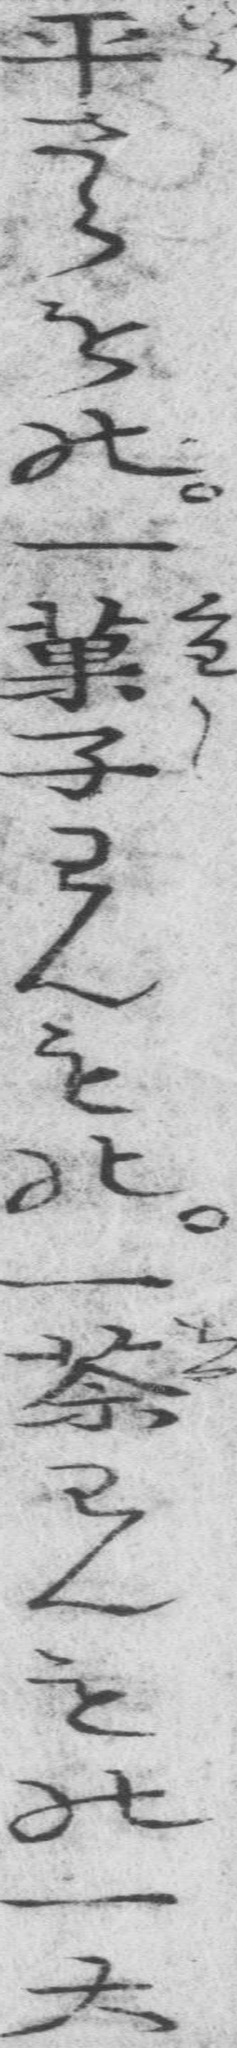平さらもの。一菓子わんもの。一茶わんもの一大
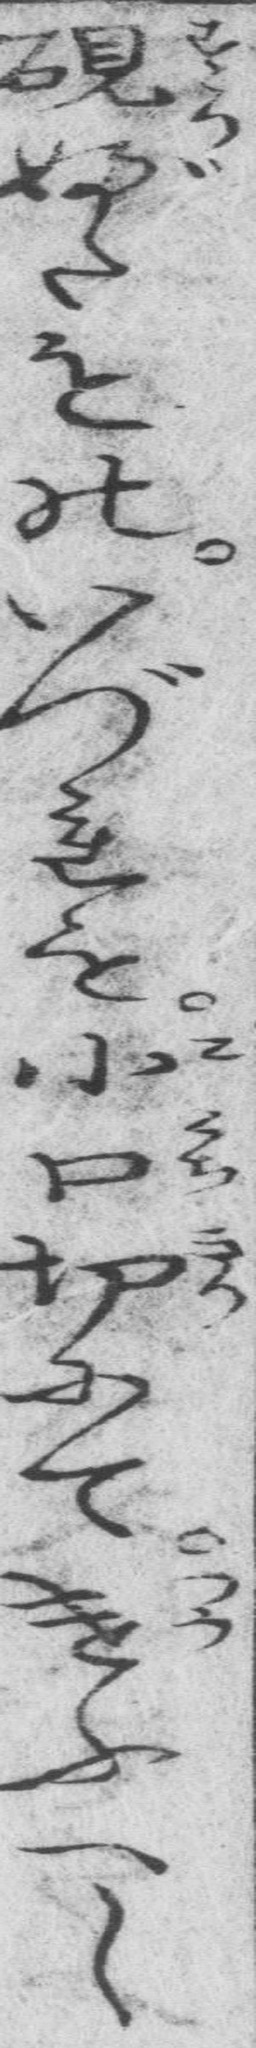硯ぶたもの。いづれも。小口切にて。遣ふへし
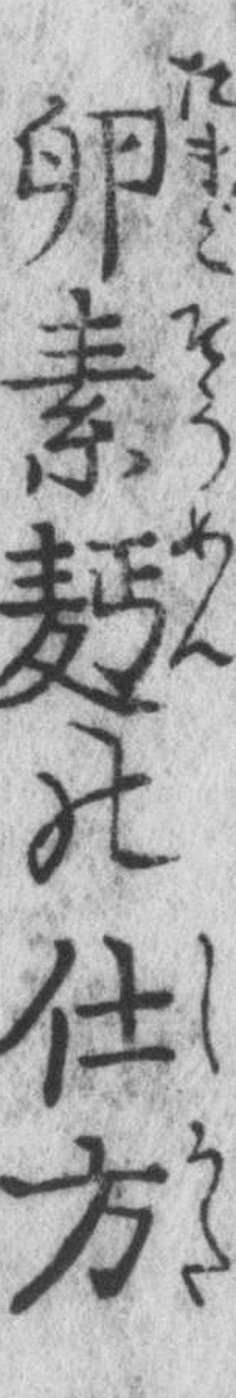卵素麺の仕方
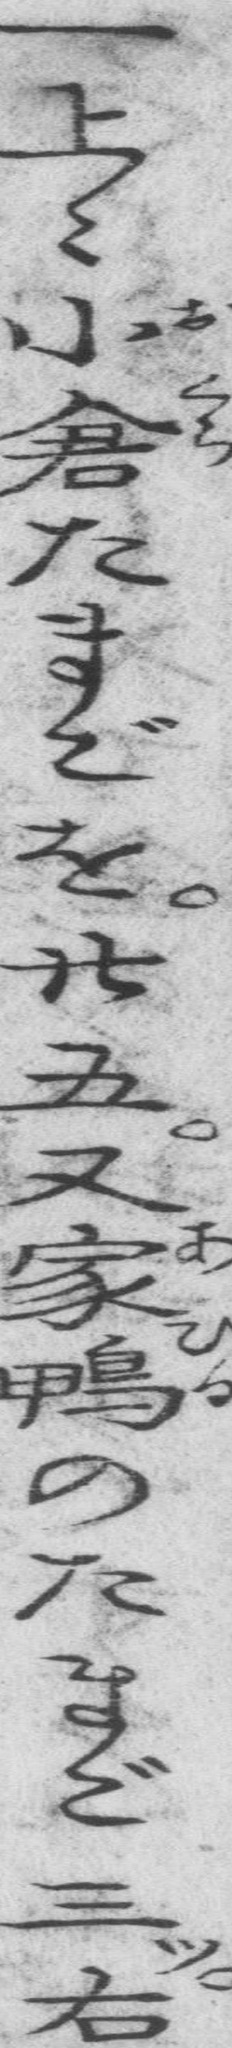一上々小倉たまごを。廿五。又家鴨のたまご三ツ。右
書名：萬寳料理秘密箱
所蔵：大阪府立大学学術情報センター 国文学研究資料館
